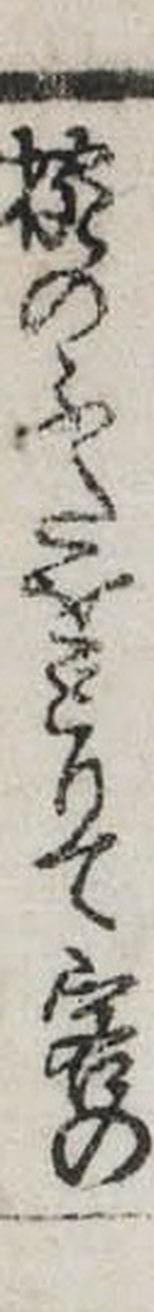椀のふたをとりて客の
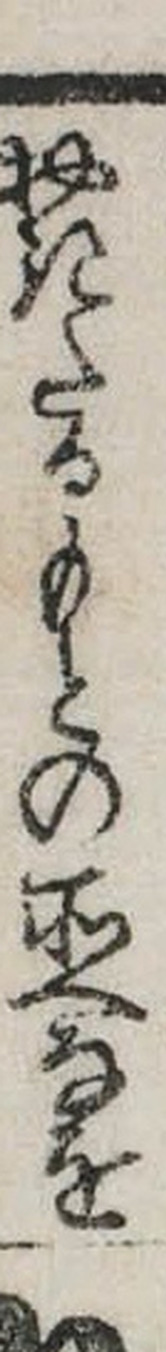おきたるものと所へなを
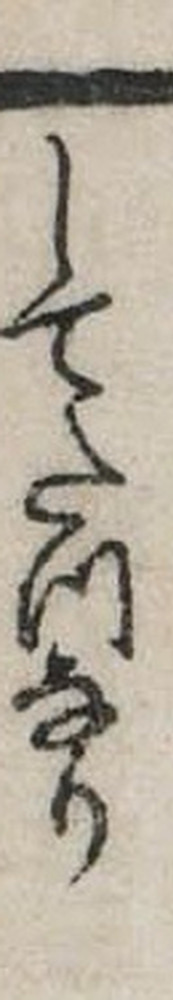してたつなり
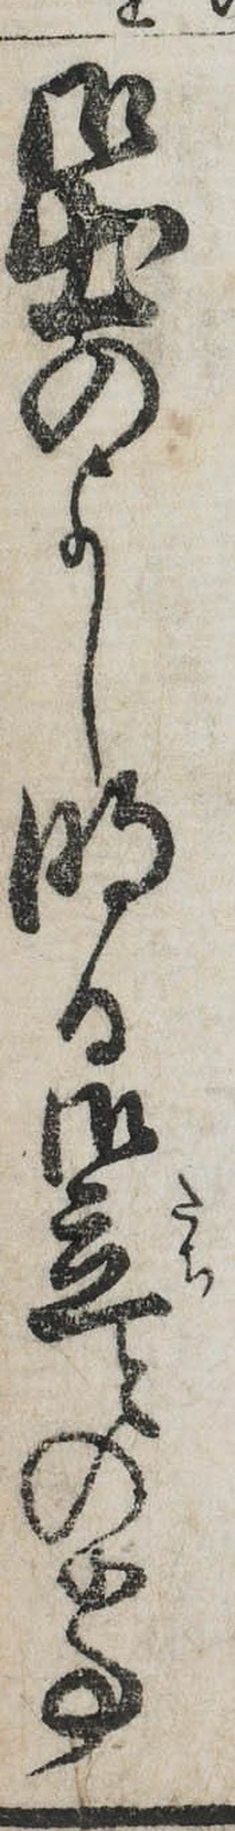御出のよし明日御立との御事

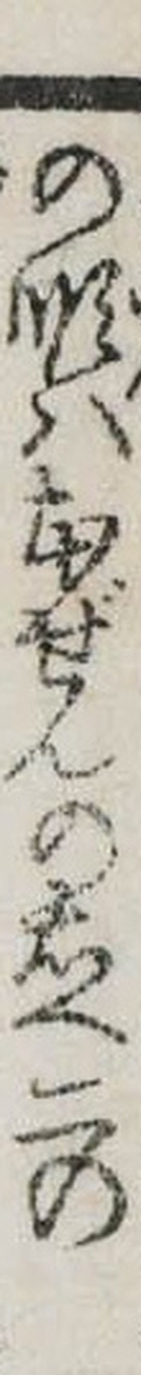の順は本ぜんの右へ二の
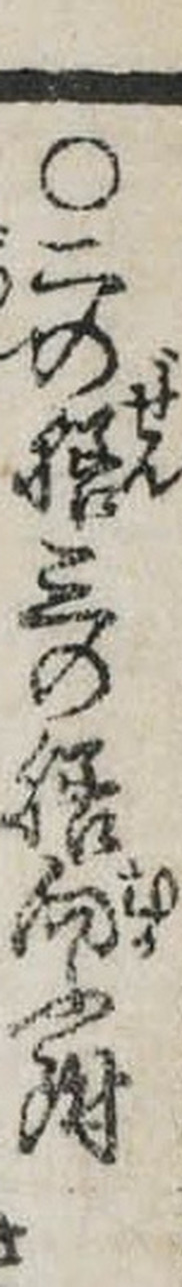○二の膳三の膳向ふ附
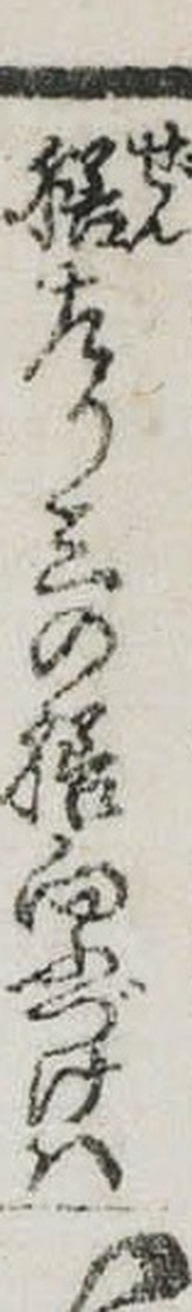膳左り三の膳向ふづけは
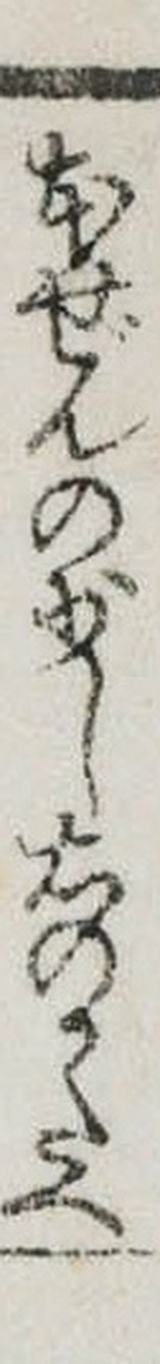本膳の少し右のかたへ
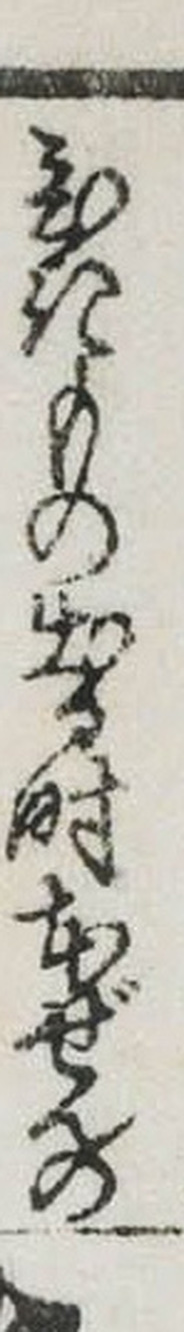ひきもの出る時本ぜんの
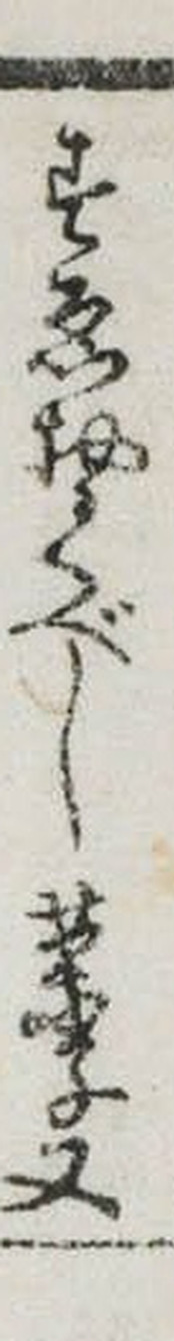すゑおくべし菓子又
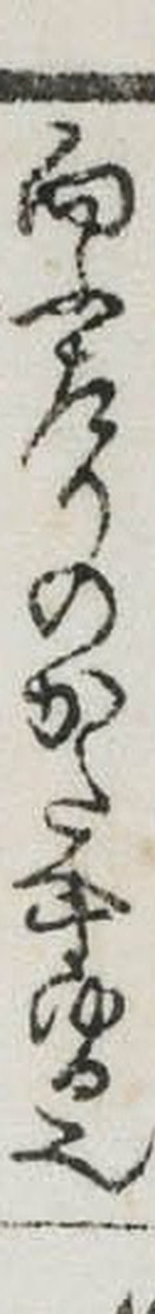向ふ左りのかたへすゆる也
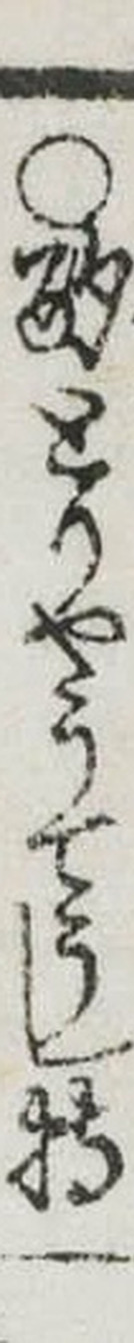○酌とりやうてうし持
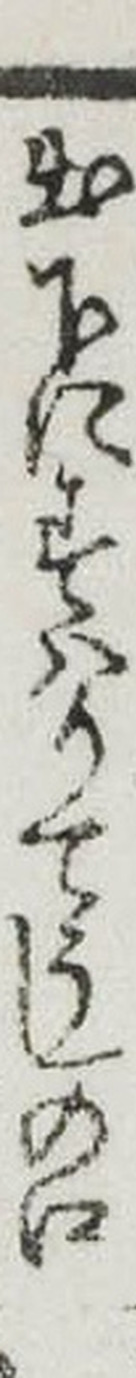出下にすはりてうしの口
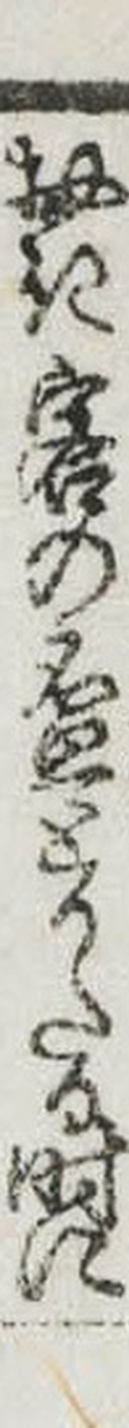おき客の盃とりたる時に
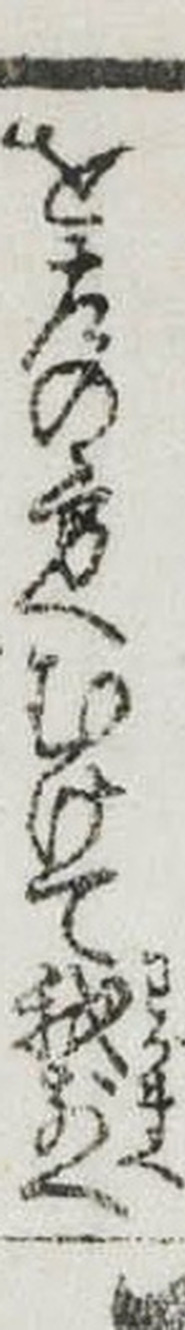を左の方へむけて我前へ
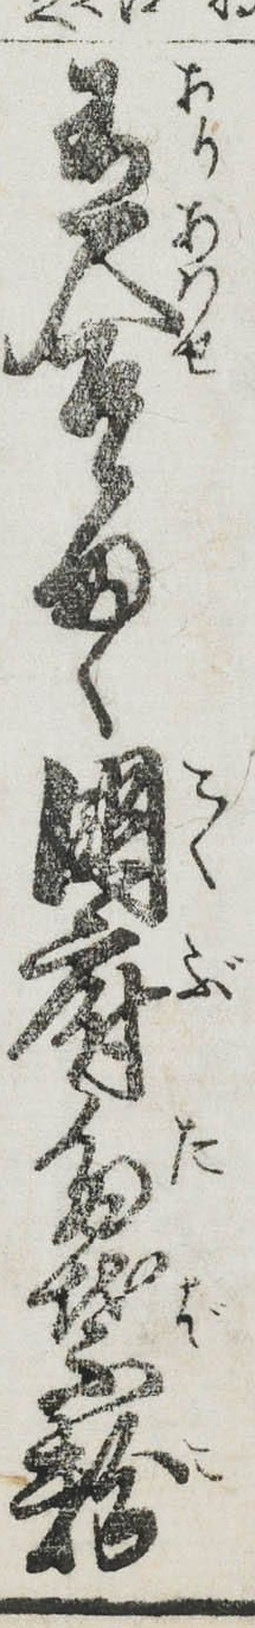有合候まゝ国府多葉粉
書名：頭書萬用婦人手紙之文言
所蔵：東京学芸大学教育コンテンツアーカイブ
